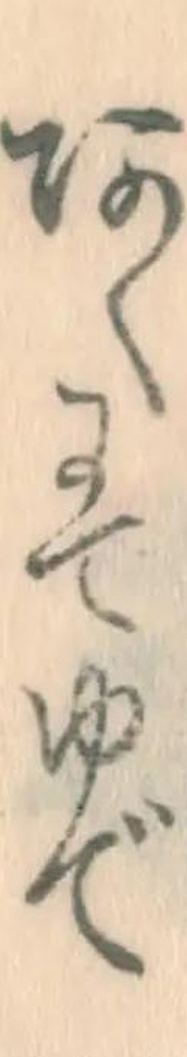あくにてゆで
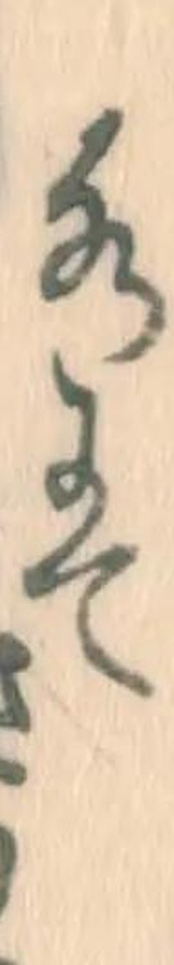水にて
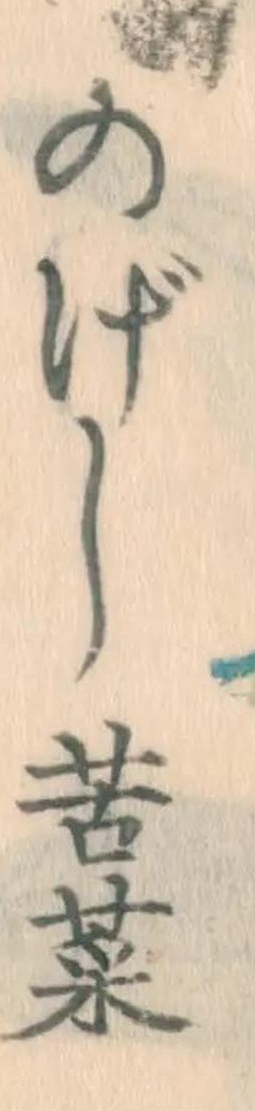のげし苦菜
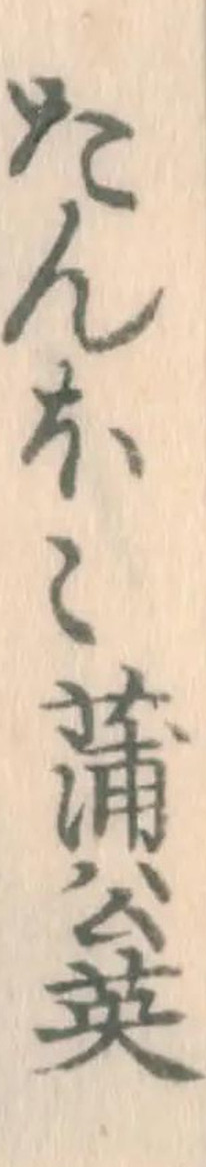たんほゝ蒲公英
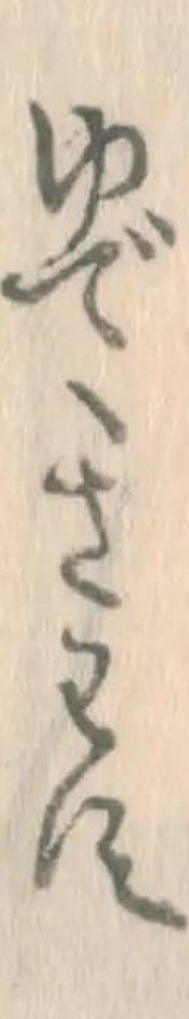ゆでゝさわす
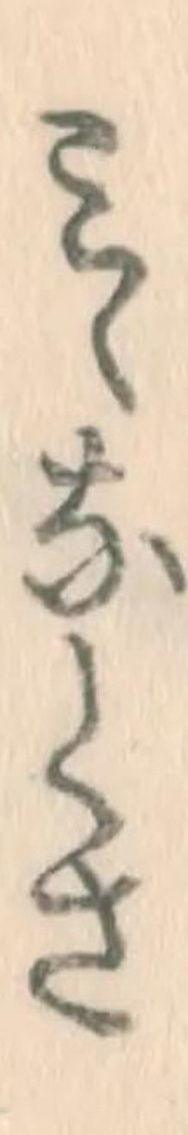みゝなくさ

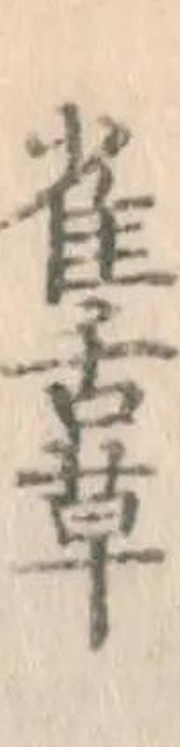雀舌草
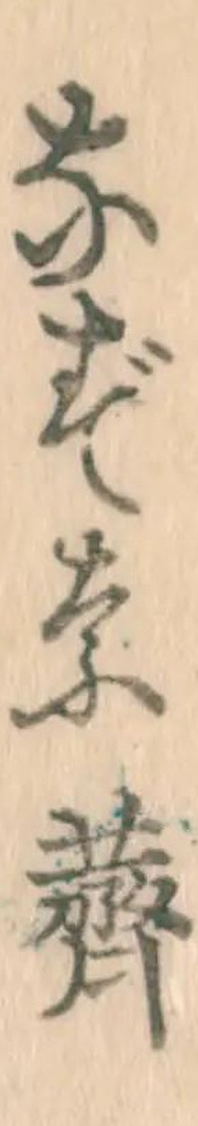なずな薺
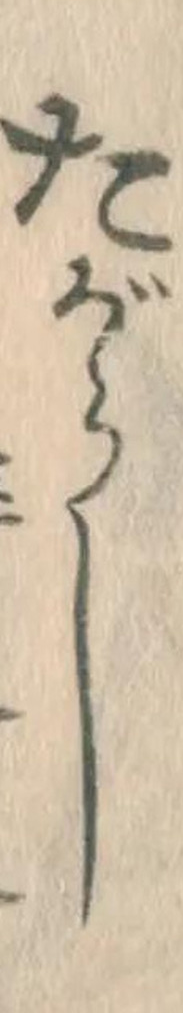たがらし
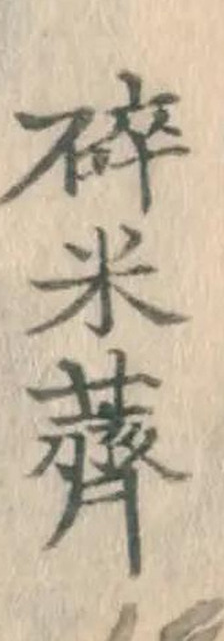碎米薺

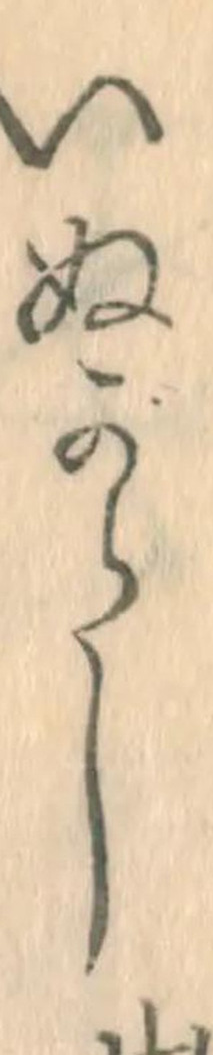いぬからし
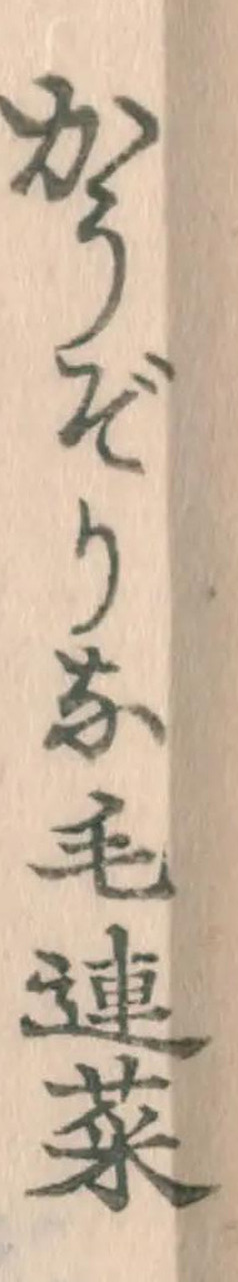かうぞりな毛連菜
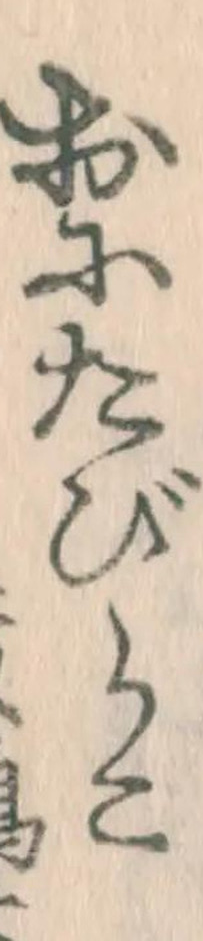おにたびらこ
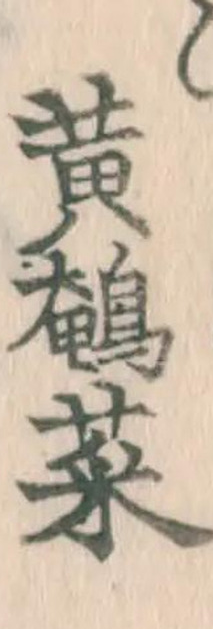黄鵪菜

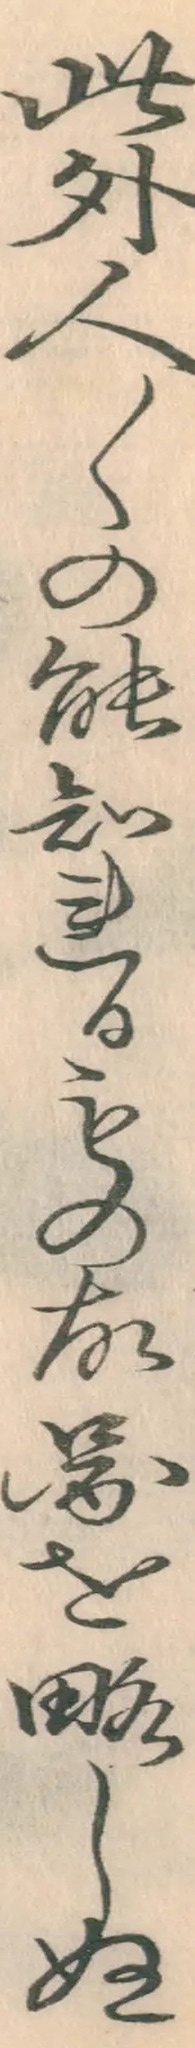此外人〳〵の能知れるもの故図を略しぬ
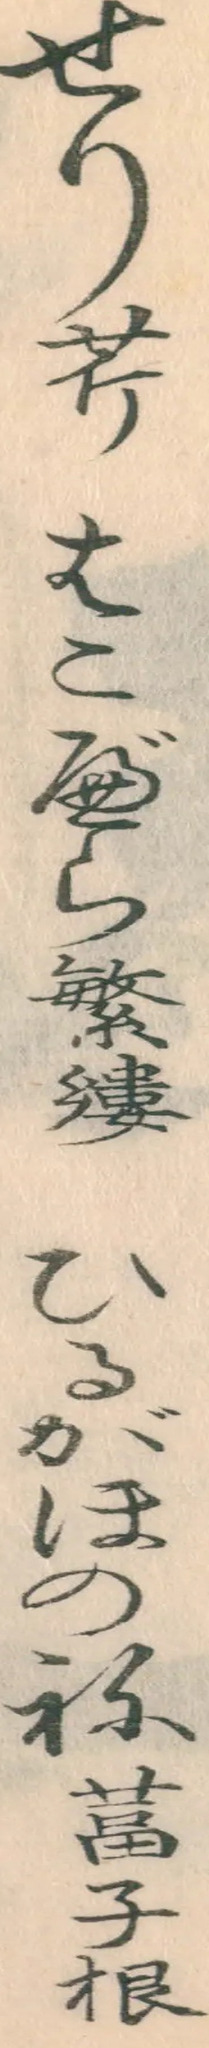せり芹はこべら繁縷ひるがほのね葍子根
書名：救荒野菜圖説
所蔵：国立国会図書館 National Diet Library, JAPAN
